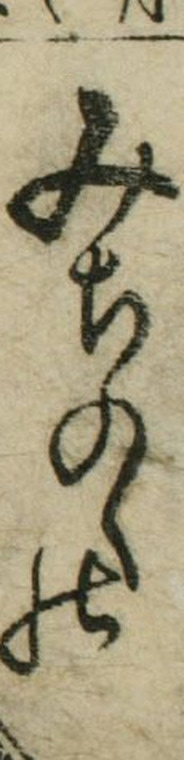みちのくの
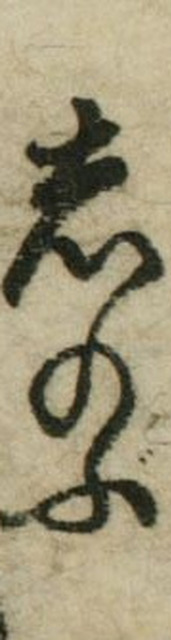しのぶ
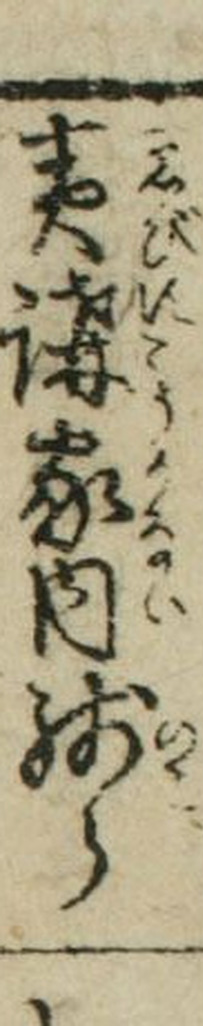夷講家内残ら
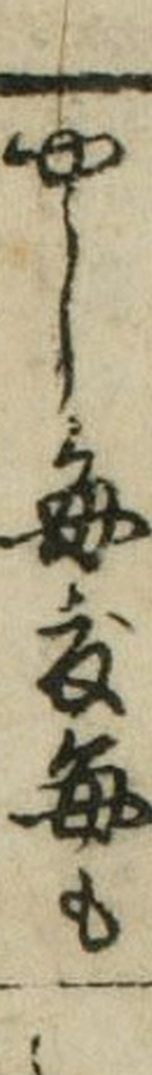やし毎度毎も
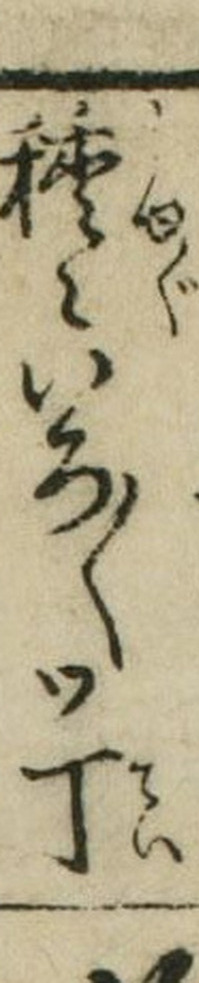種々いろ〳〵御丁
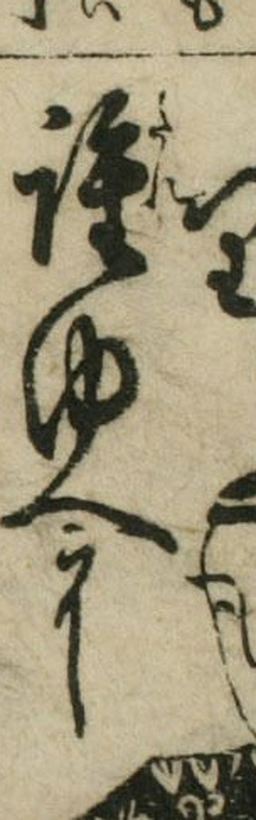誰ゆへに
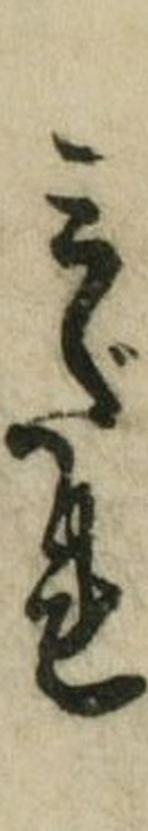みだれ
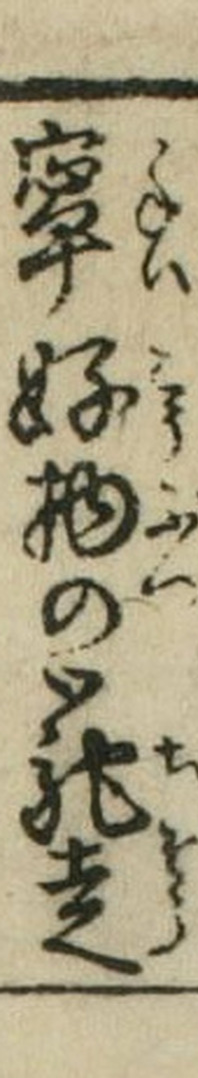寧好物の御馳走
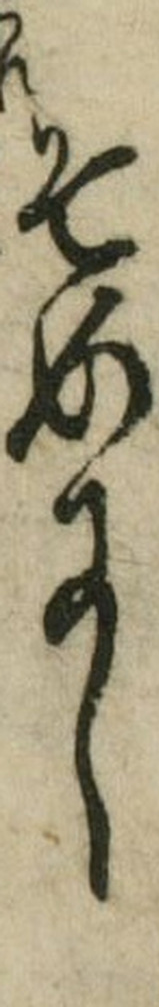そめにし
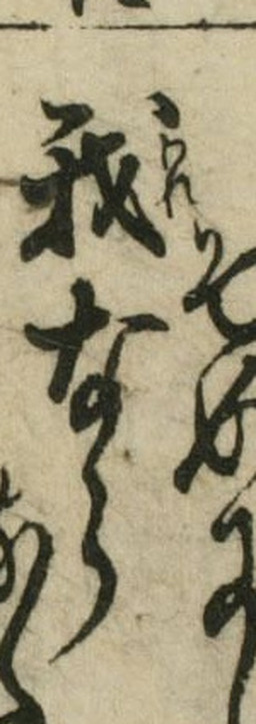我なら
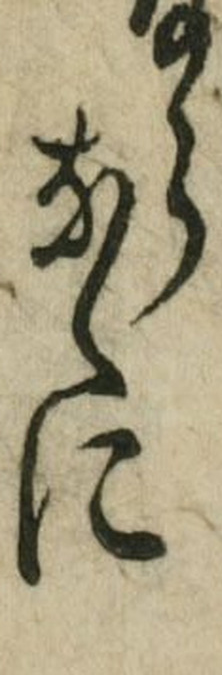なくに
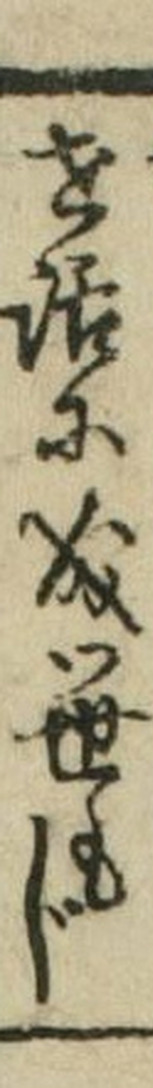世話に成御世もじ
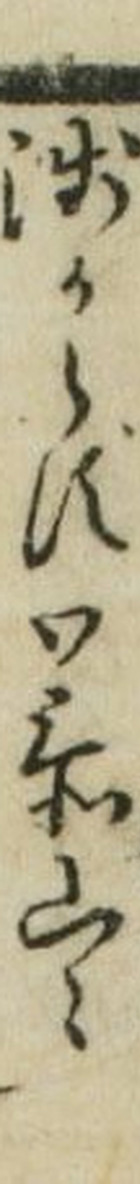浅からず御忝山々
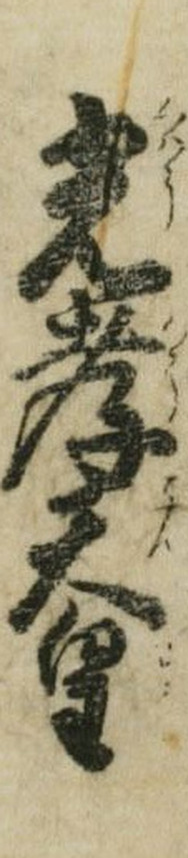光孝天皇
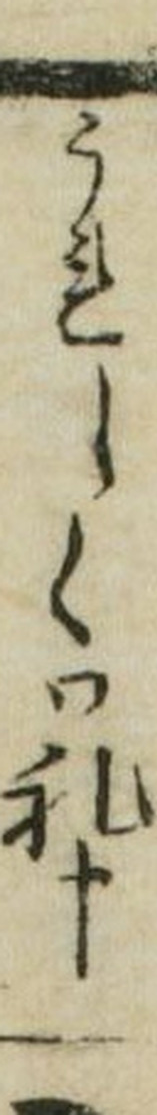うれしく御礼申
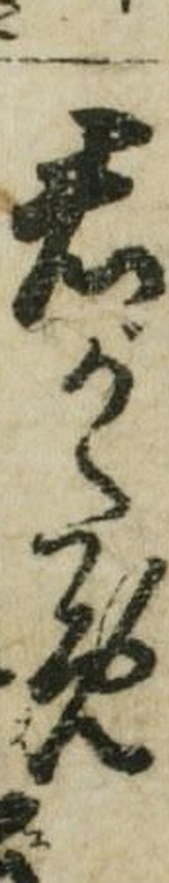君がため
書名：百人一首
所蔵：東京学芸大学教育コンテンツアーカイブ
